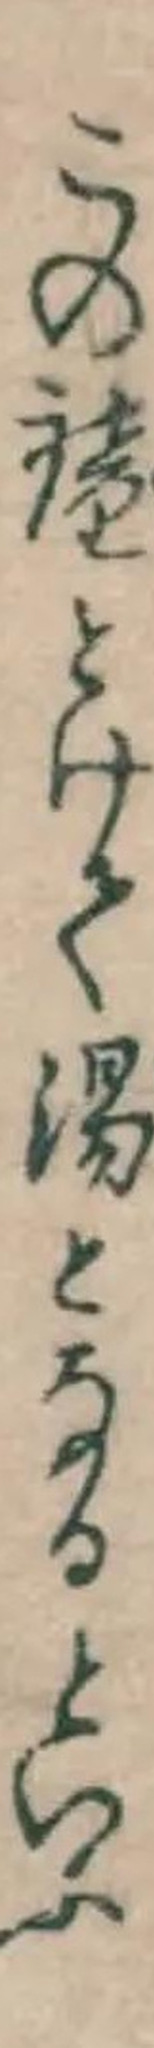この鐘とけて湯となるといふ
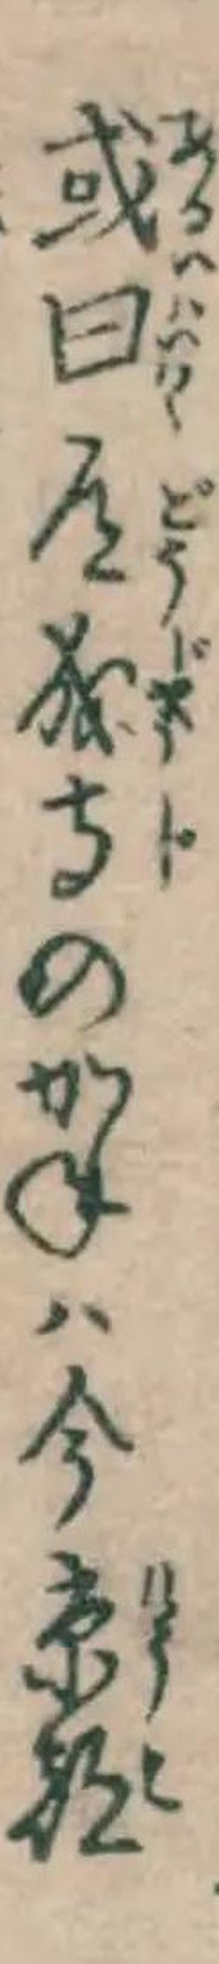或曰道成寺のかねは今京都
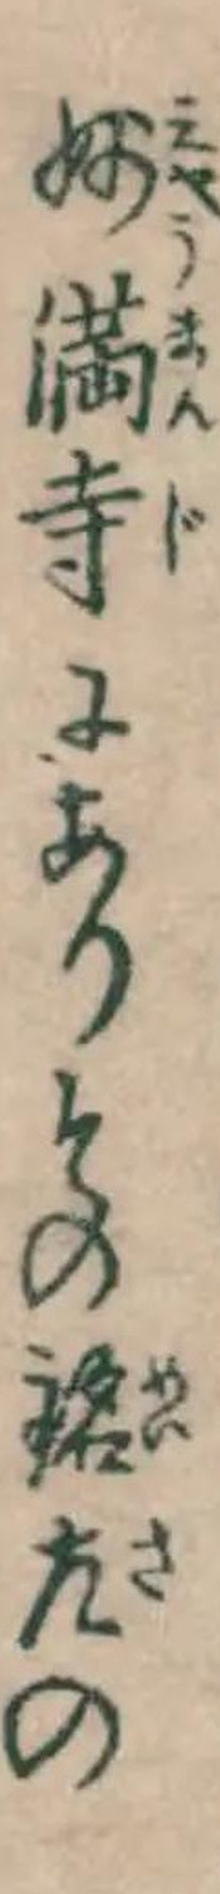妙満寺にありその銘左の
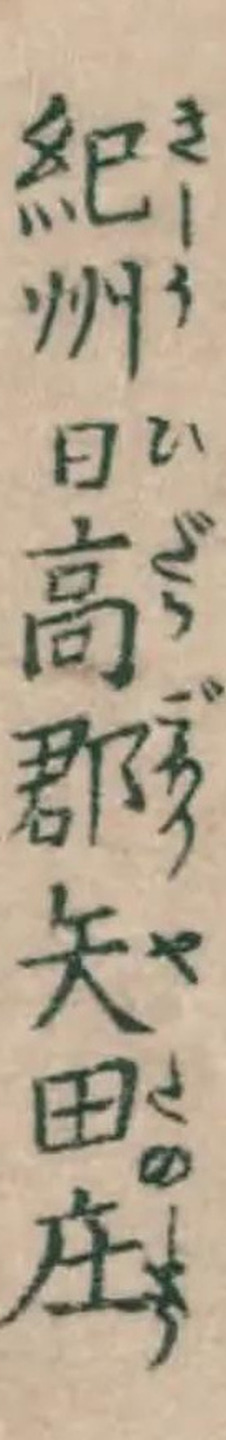紀州日高郡矢田庄
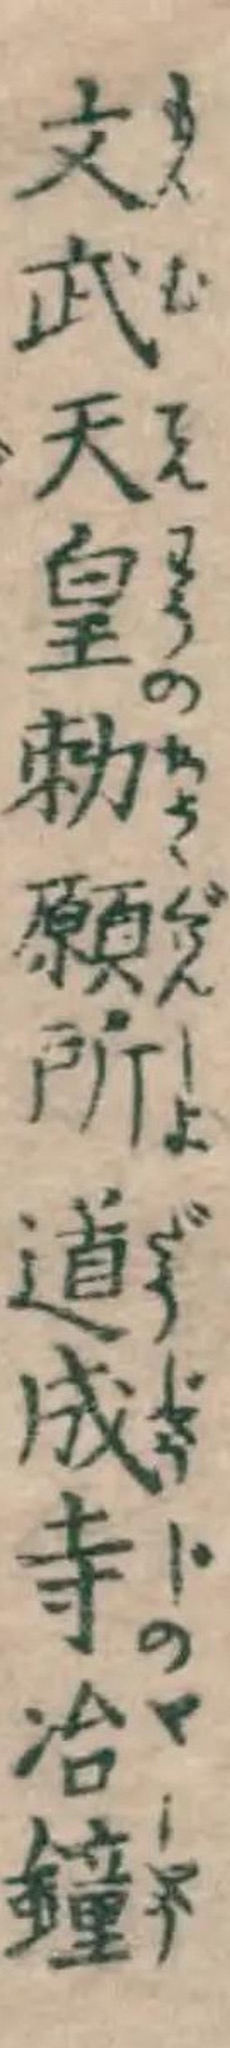文武天皇勅願書道成寺冶鐘
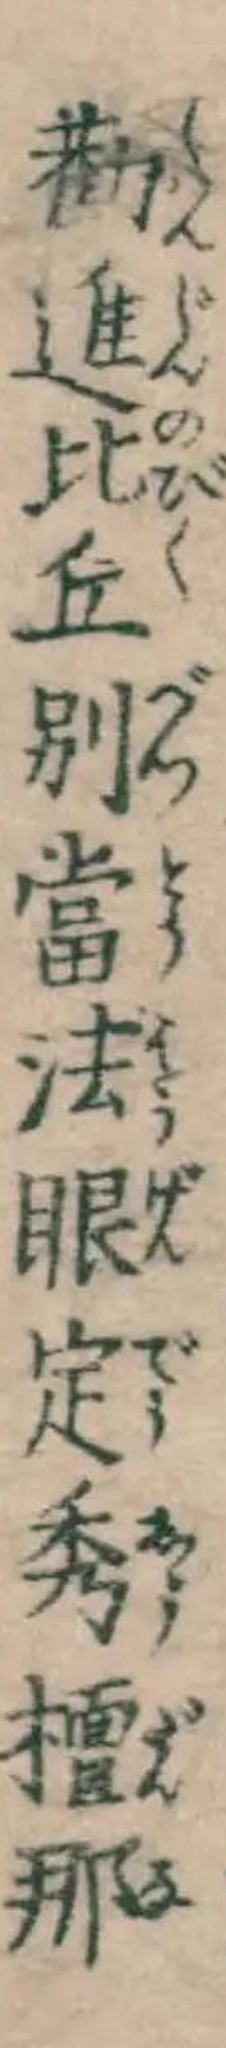勧進比丘別当法眼定秀檀那
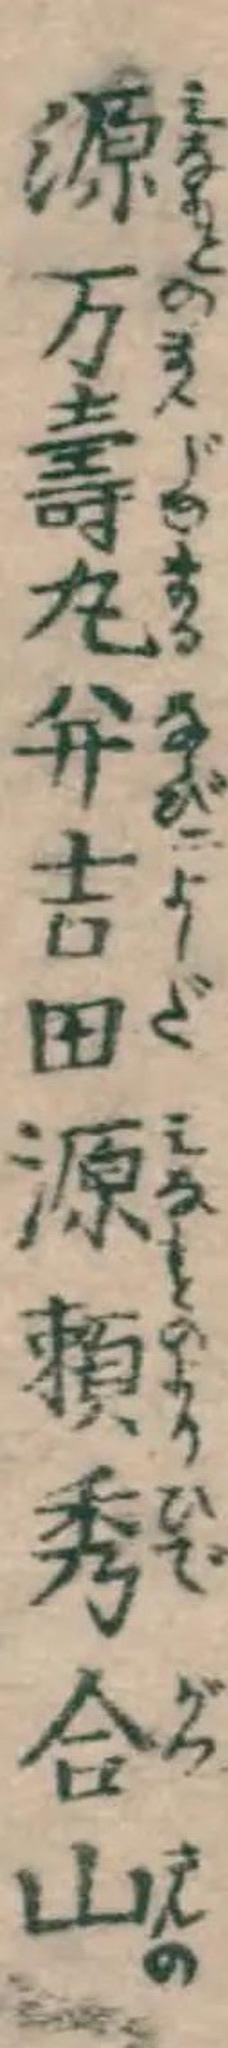源万寿丸并吉田源頼秀合山
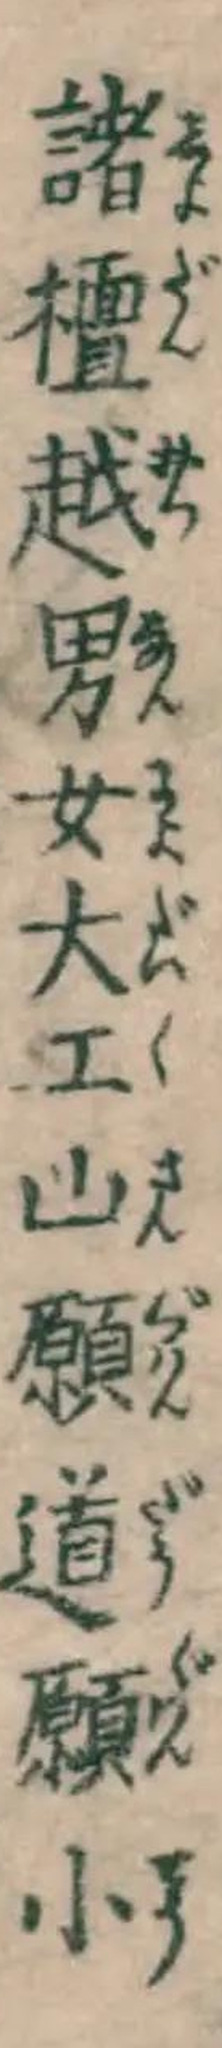諸檀越男女大工山願道願小
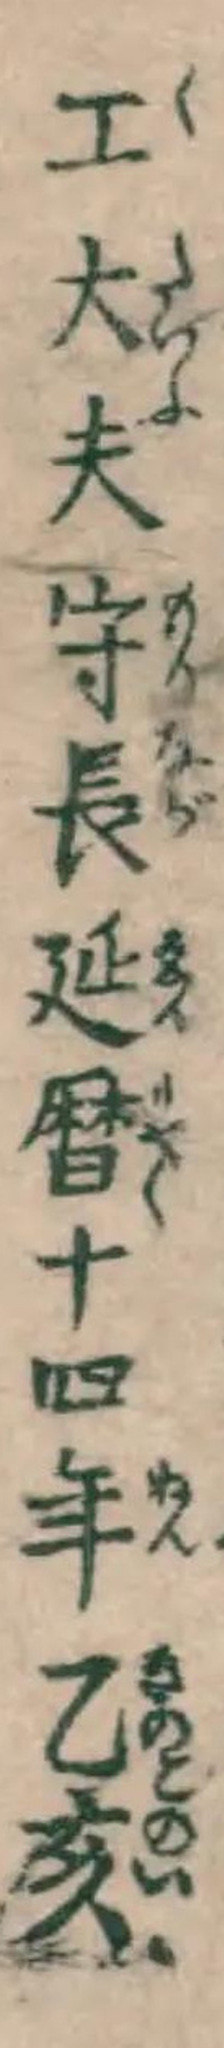工大夫守長延暦十四年乙亥
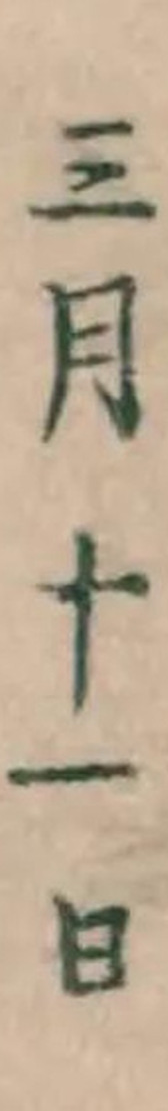三月十一日
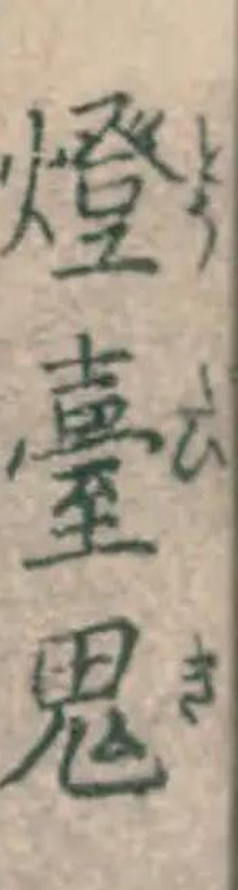灯台鬼
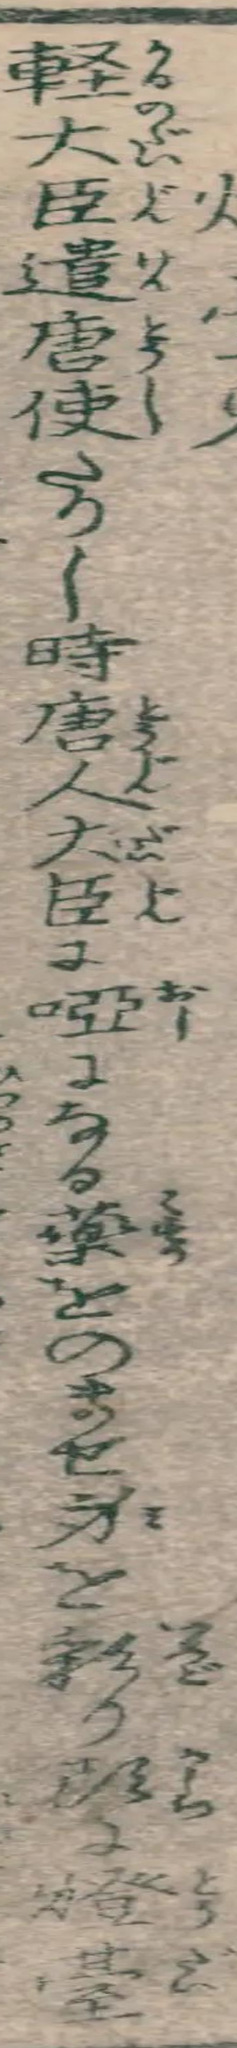軽大臣遣唐使たりし時唐人大臣に唖になる薬をのませ身を彩り頭に灯台
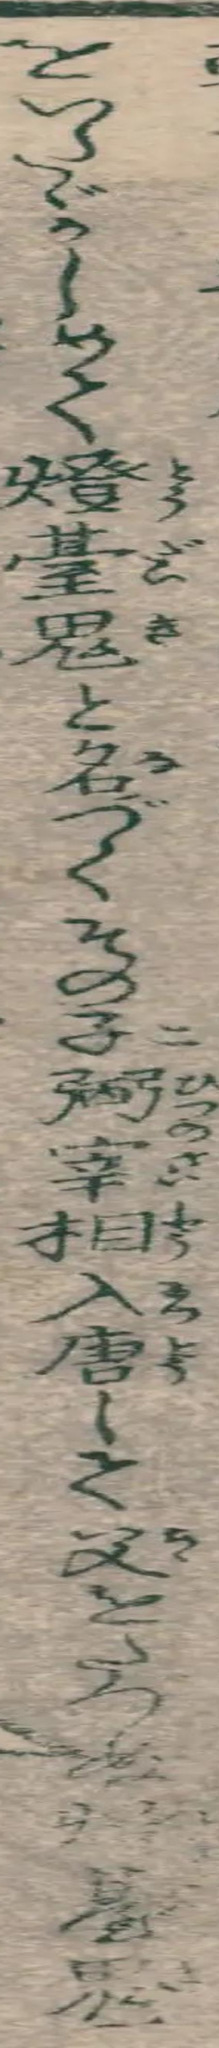をいたゞかしめて灯台鬼と名づくその子弼宰相入唐して父をたつぬ灯台鬼
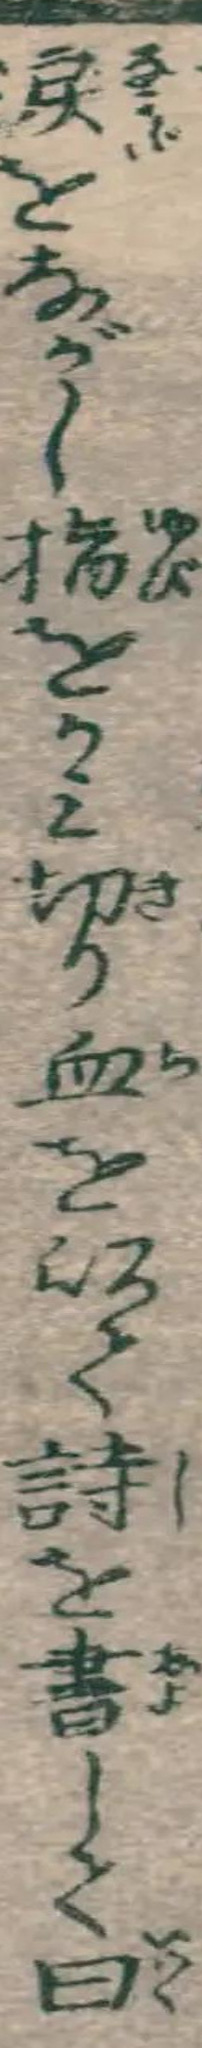涙をながし指をかみ切り血を以て詩を書して曰
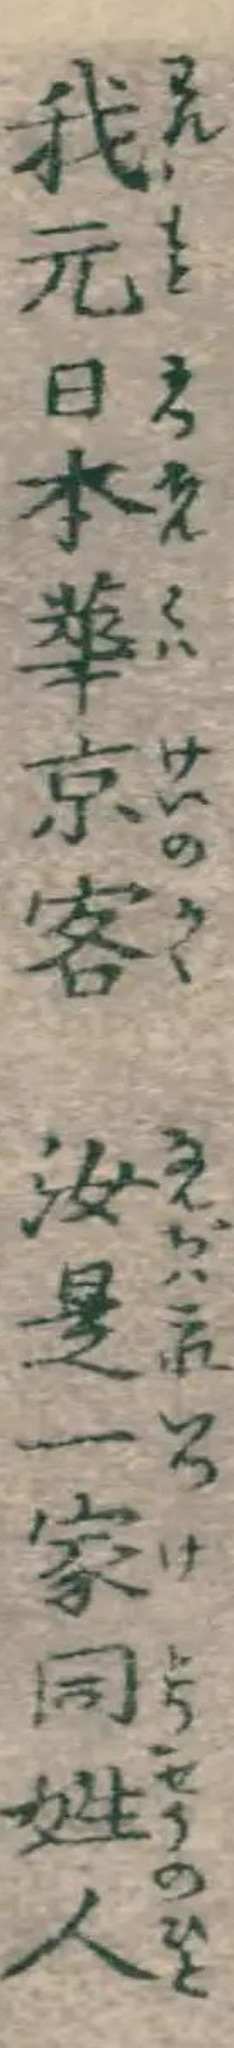我元日本華京客汝是一家同姓人
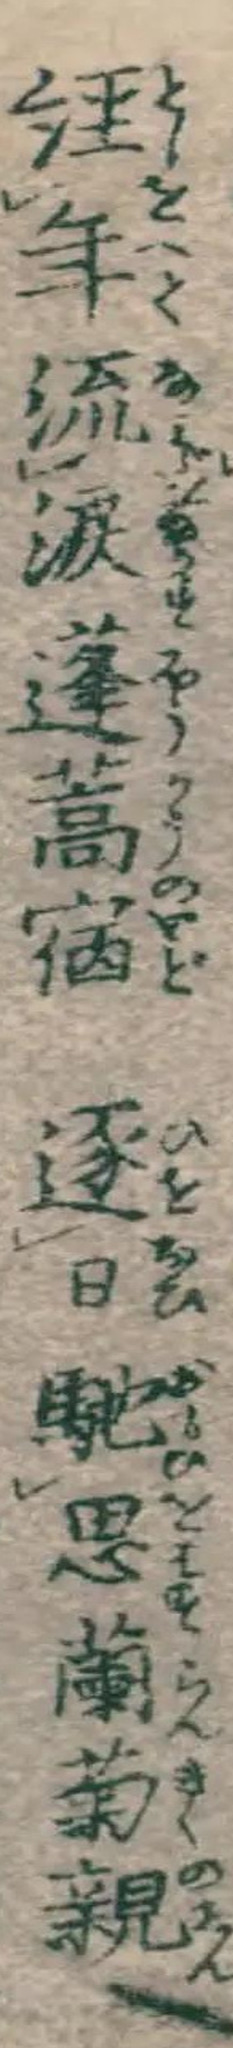経年流涙蓬蒿宿遂日馳思蘭菊親
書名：百鬼夜行 3巻拾遺3巻. [2]
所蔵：国立国会図書館 National Diet Library, JAPAN
